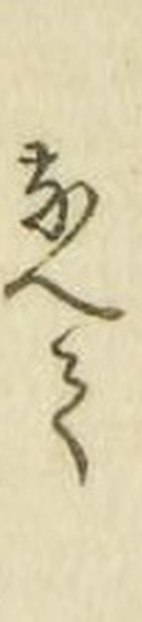なへて
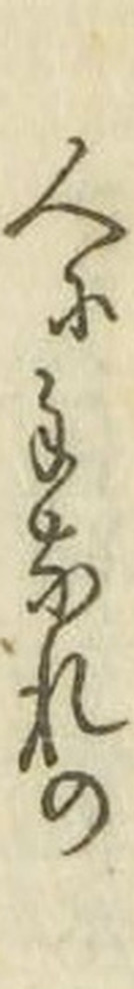人に手なれの
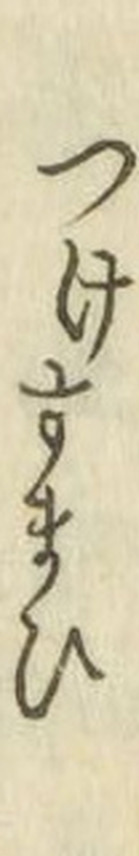つけすまひ
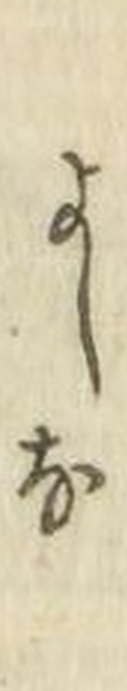よしな

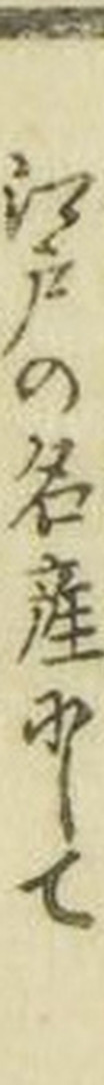江戸の名産にして
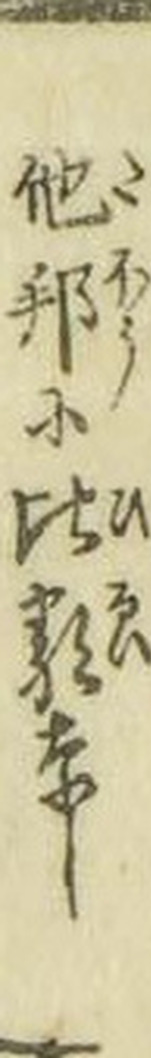他邦に比類なし
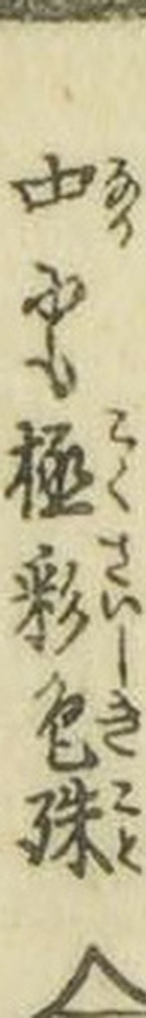中にも極彩色殊
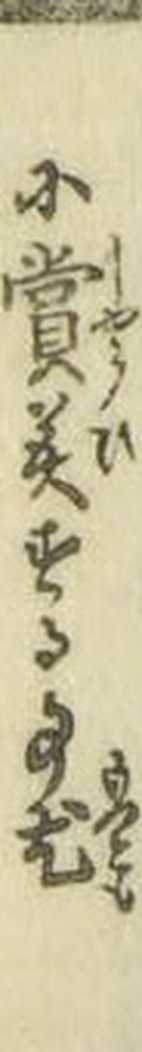に賞美する事尤
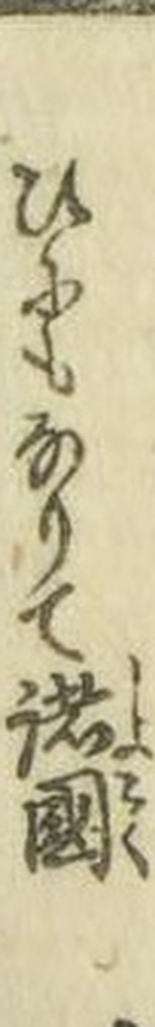ひにもなりて諸国
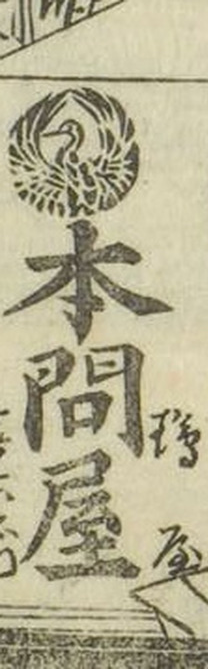本問屋
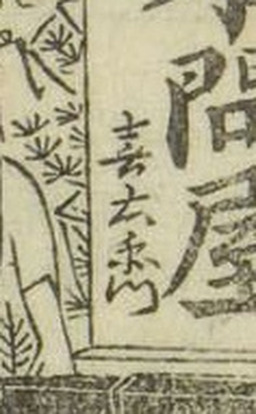喜右衛門

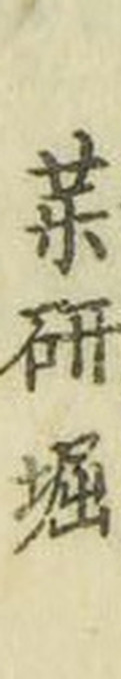薬研堀

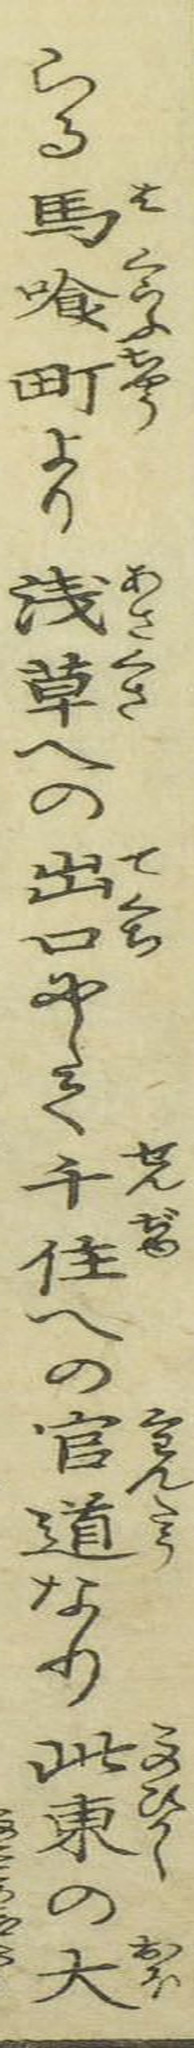らる馬喰町より浅草への出口にして千住への官道なり此東の大
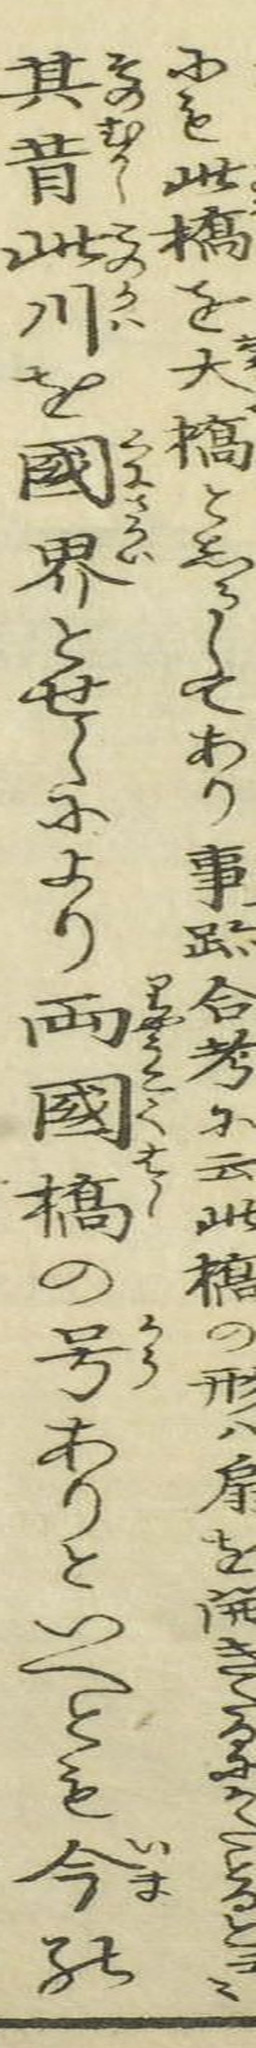其昔此川を国界とせしにより両国橋の号ありといへとも今の
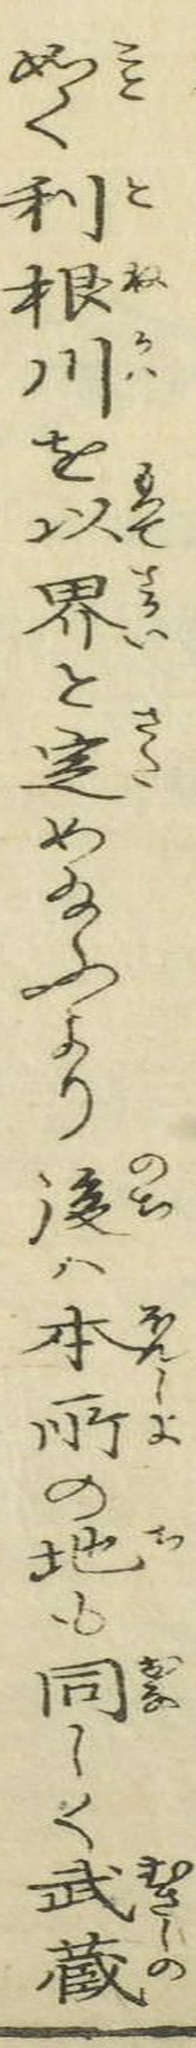如く利根川を以界と定め給ふにより後は本所の地も同しく武蔵
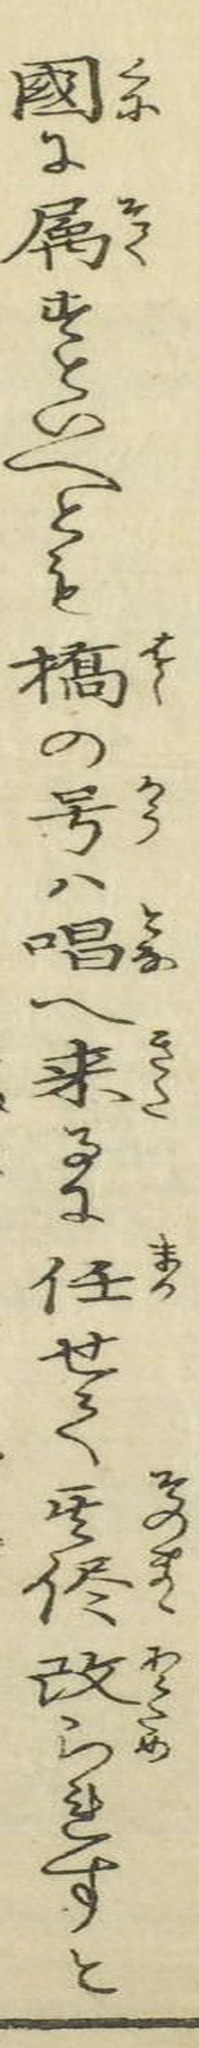国に属すといへとも橋の号は唱へ来るに任せて其侭改られすと
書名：江戸名所図会 20巻 巻之1
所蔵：東京学芸大学教育コンテンツアーカイブ
